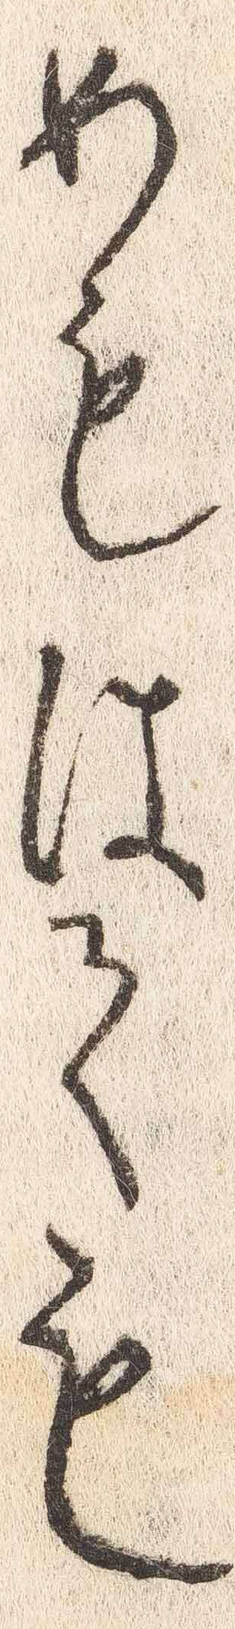めもはても
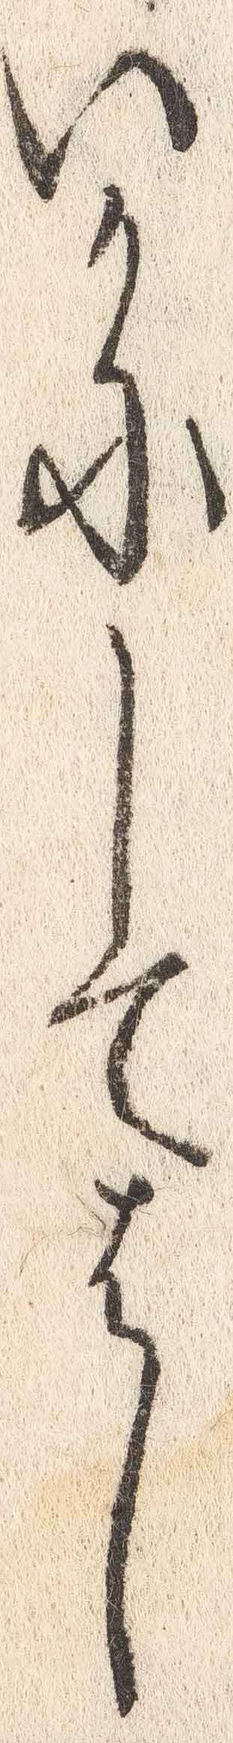いかにしてはし
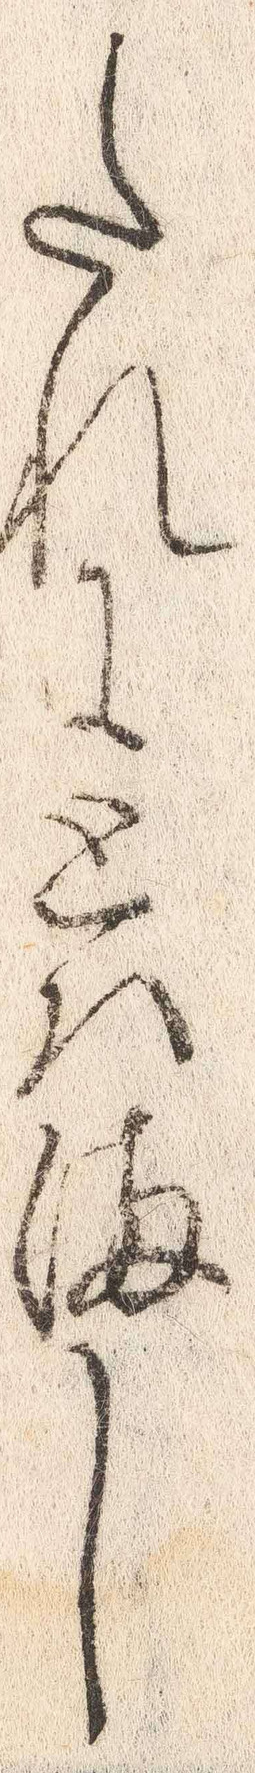たれにとはまし
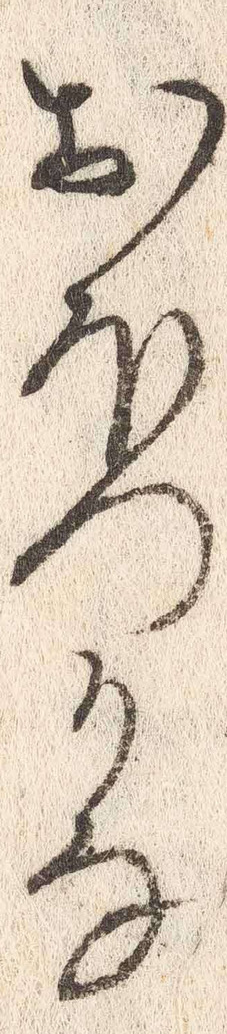おほつかな

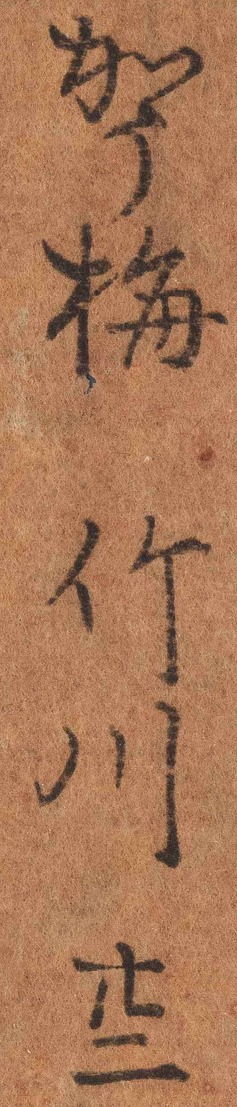かう梅竹川廿二

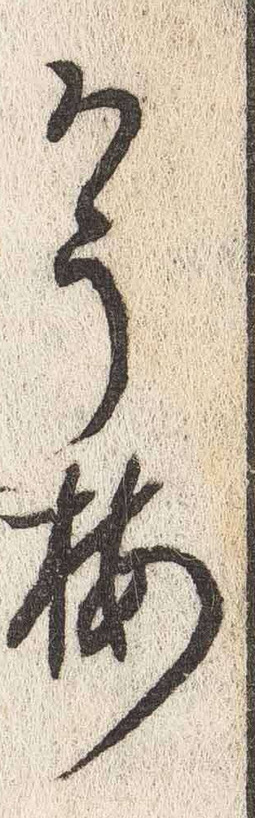かう梅
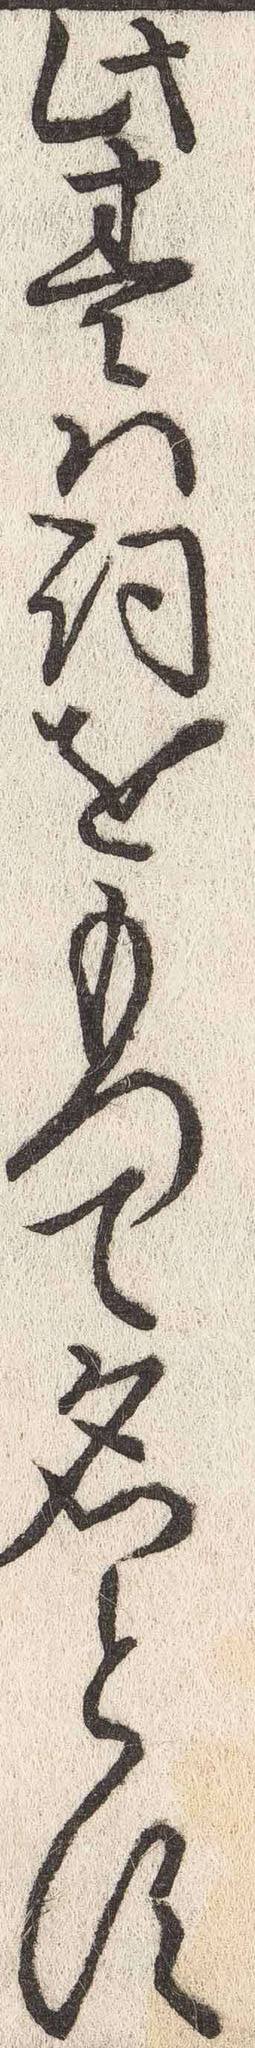此巻は詞をもつて名とす
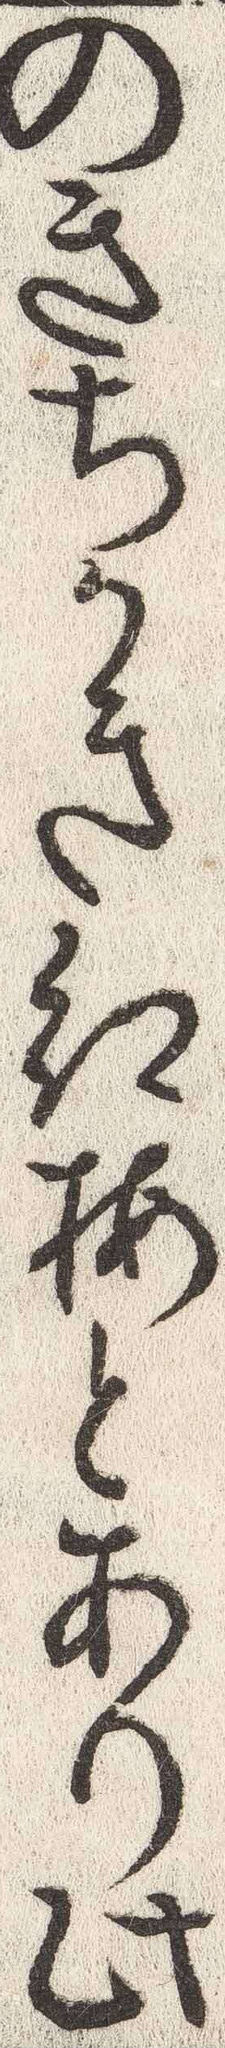のきちかき紅梅とあり此
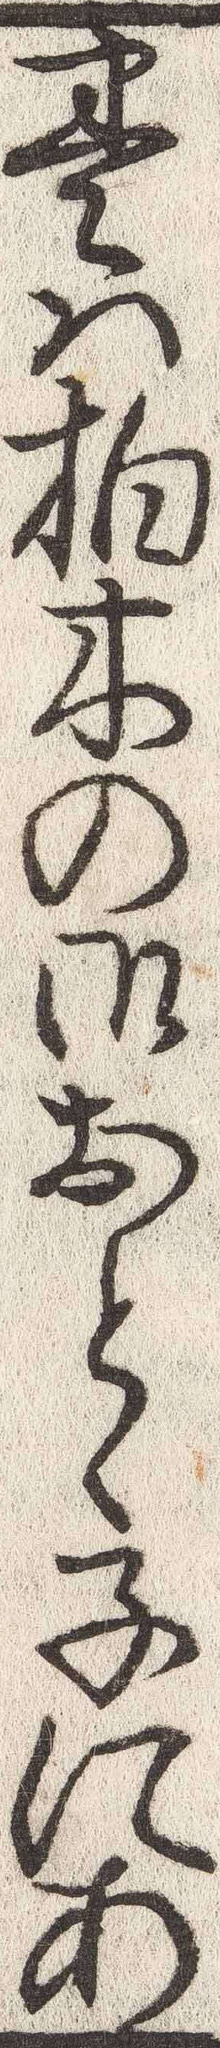巻は柏木の御おとゝ子にあ
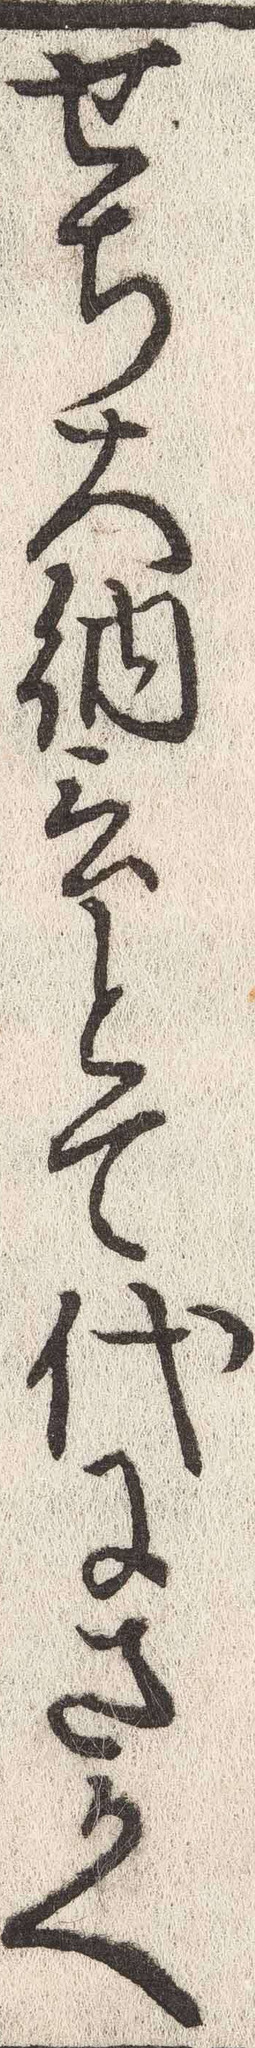せち大納言とて代にさかへ
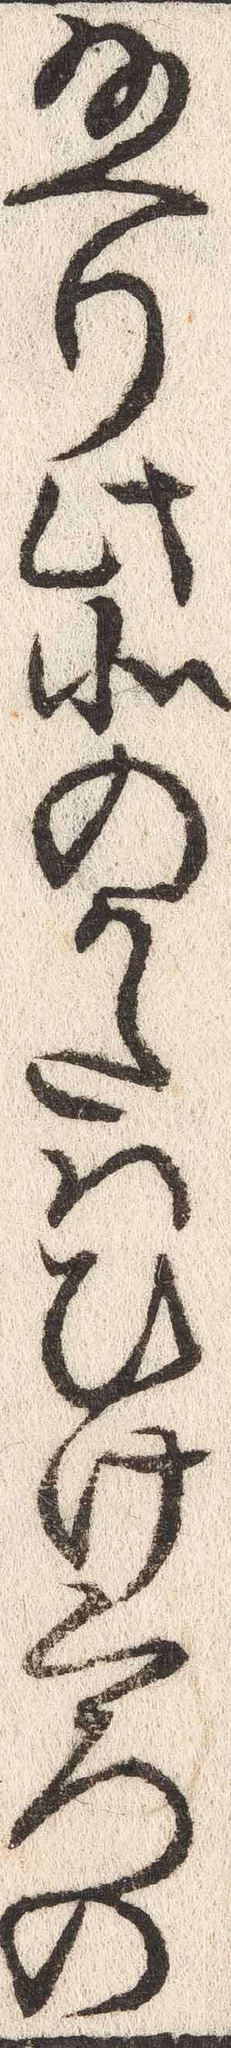給へり此北のかたはひけくろの
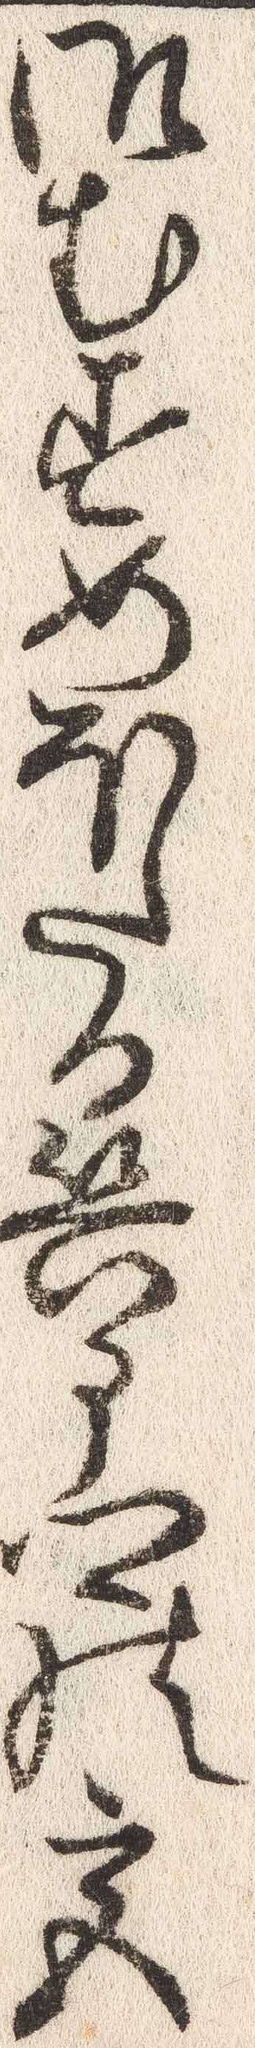御むすめほたる兵部卿の宮
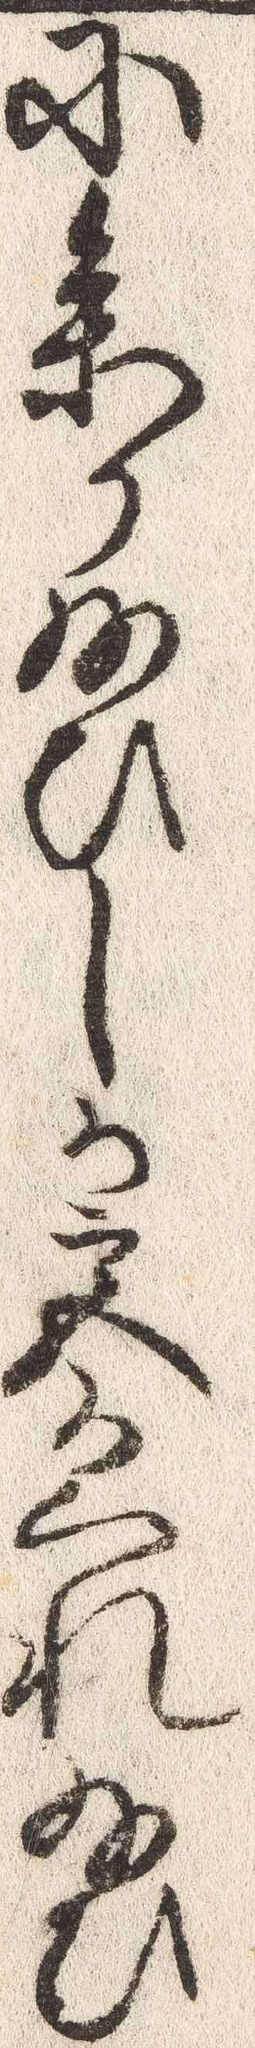に参り給ひしか宮かくれ給ひ
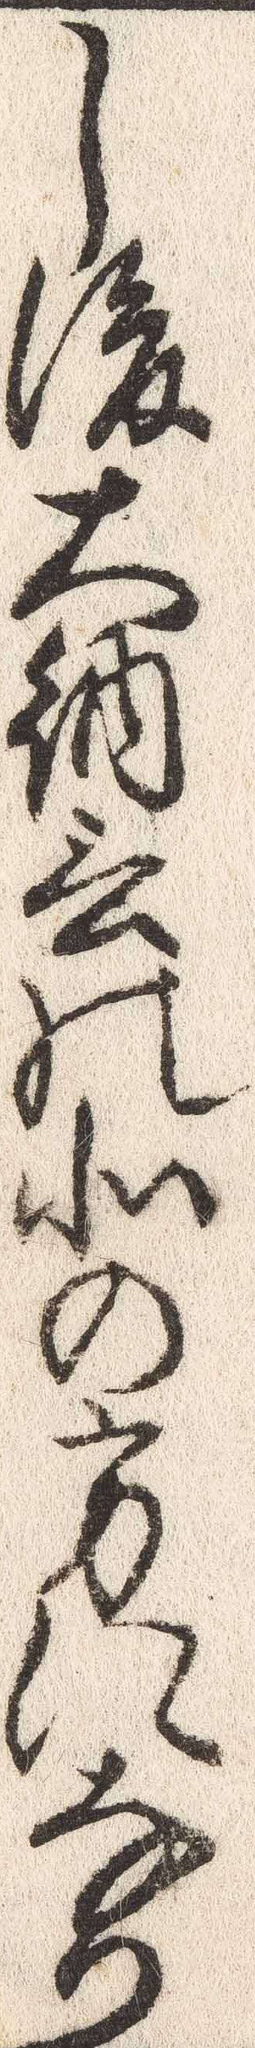し後大納言の北の方になり
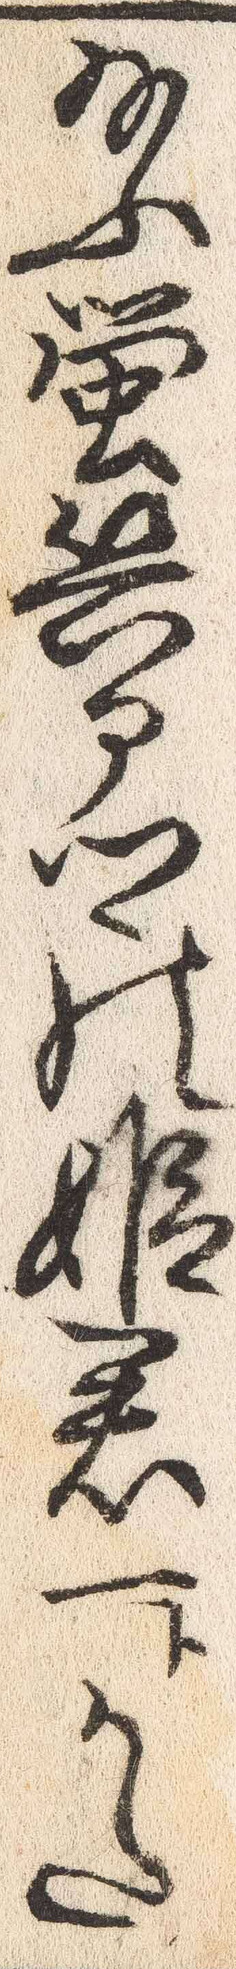給ふ蛍兵部卿の姫君一かた

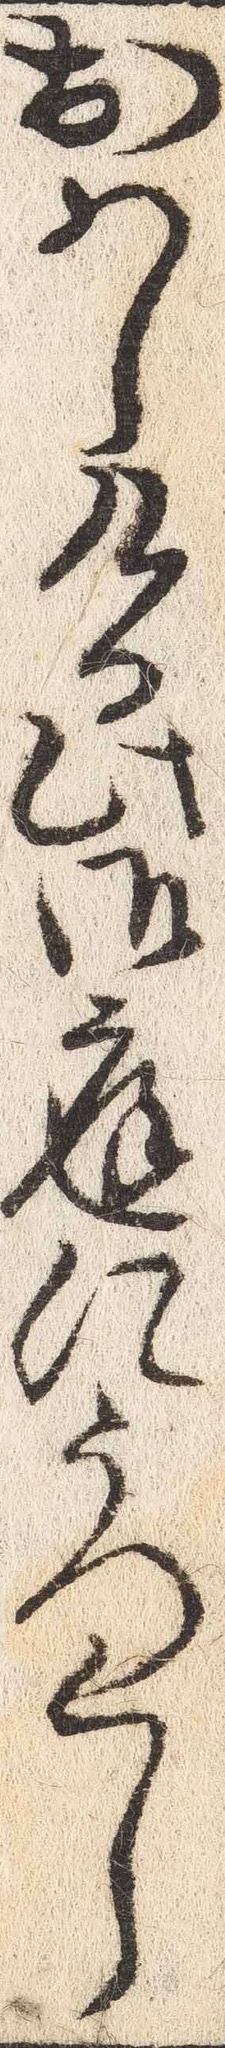おはしける此御庭にうつくし
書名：源氏物語
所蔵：東京学芸大学附属図書館 国文学研究資料館
